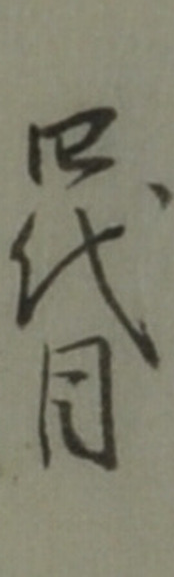四代目
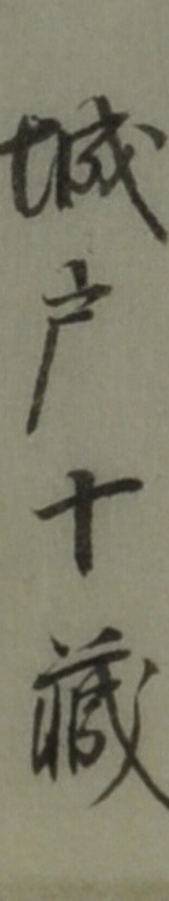城戸十蔵
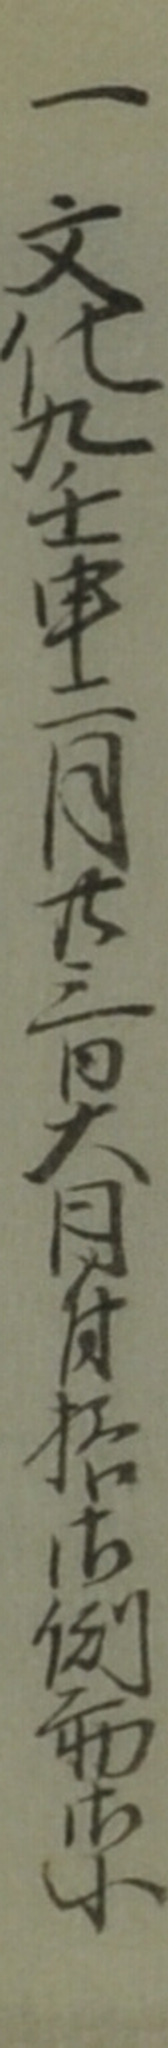一文化九壬申二月廿三日大目付格御側勤御小
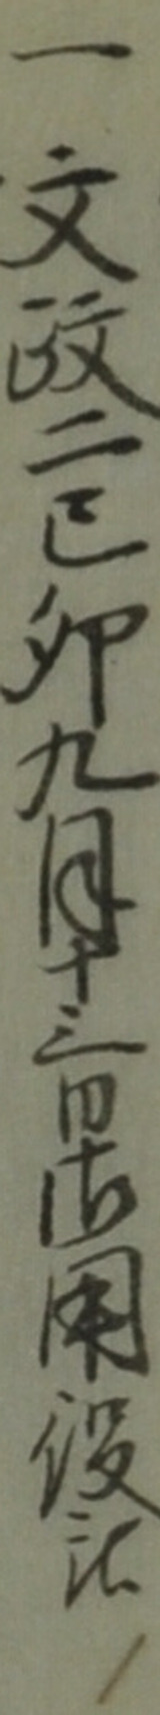一文政二己卯九月十三日御用役被
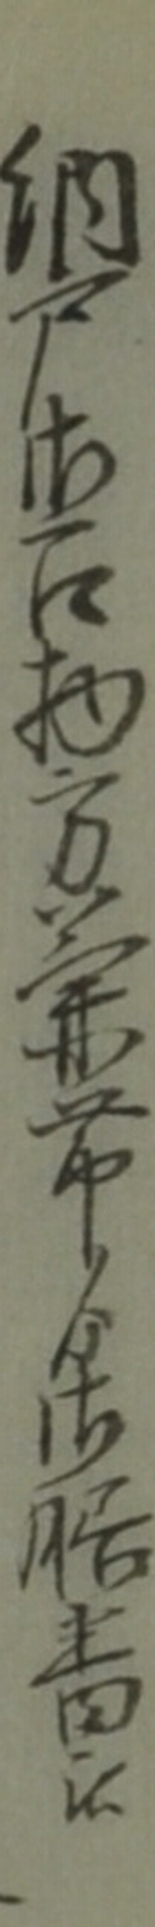納戸御召物方兼帯ゟ御膳番被
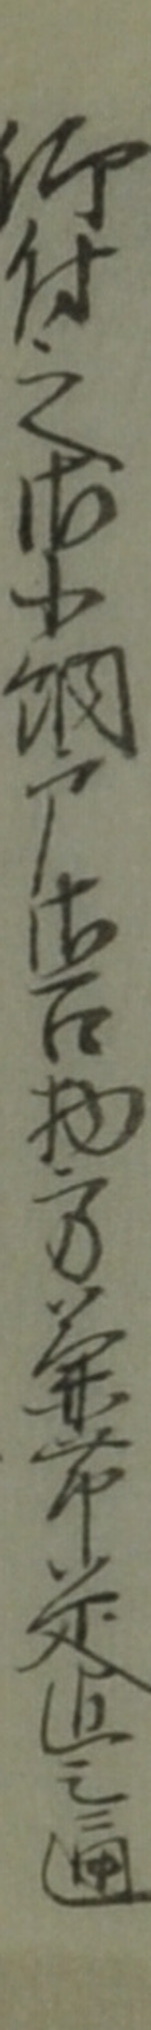仰付之御小納戸御召物方兼帯是迄之通
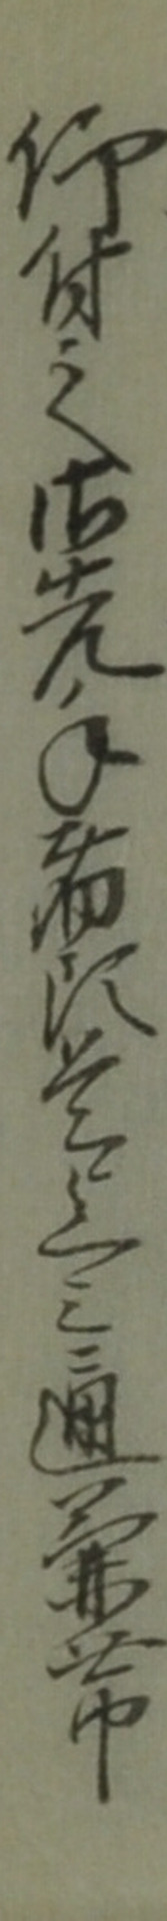仰付之御先手者頭是迄之通兼帯
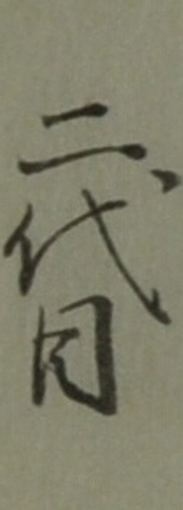二代目
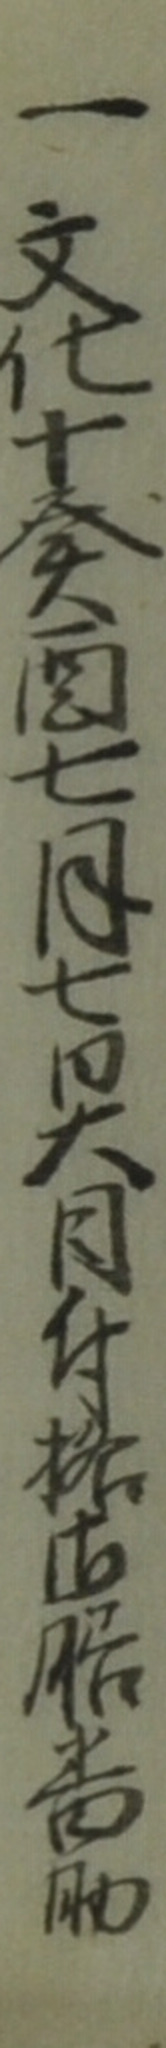一文化十癸酉七月七日大目付格御膳番助
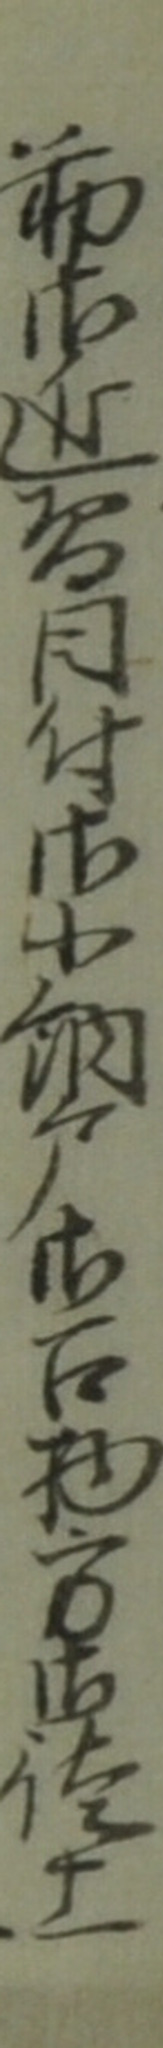勤近習目付御小納戸御召物方御徒士
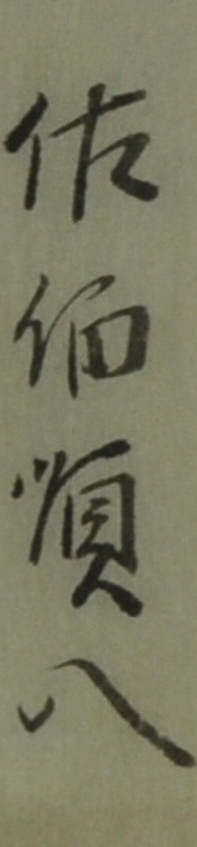佐伯順八
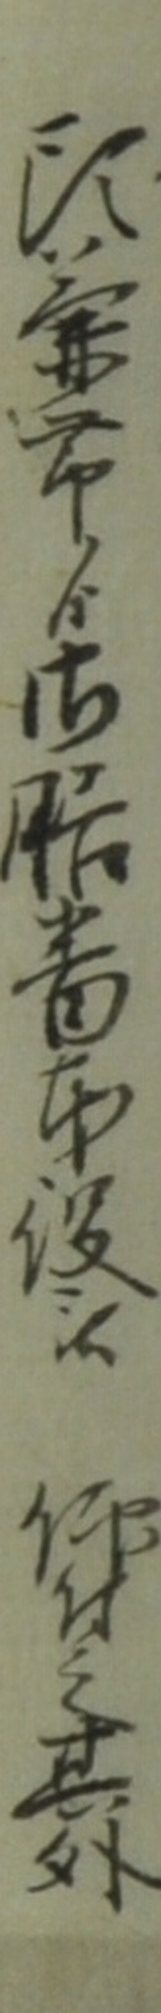頭兼帯ゟ御膳番本役被仰付之其外

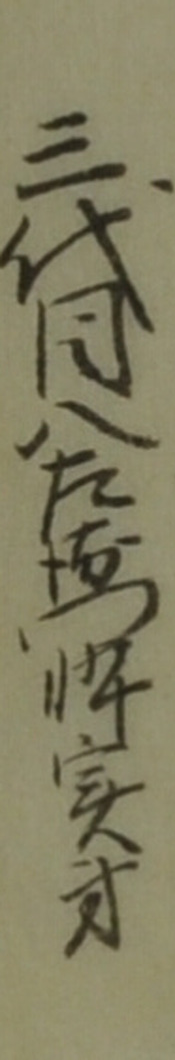三代目八左衛門忰実弟
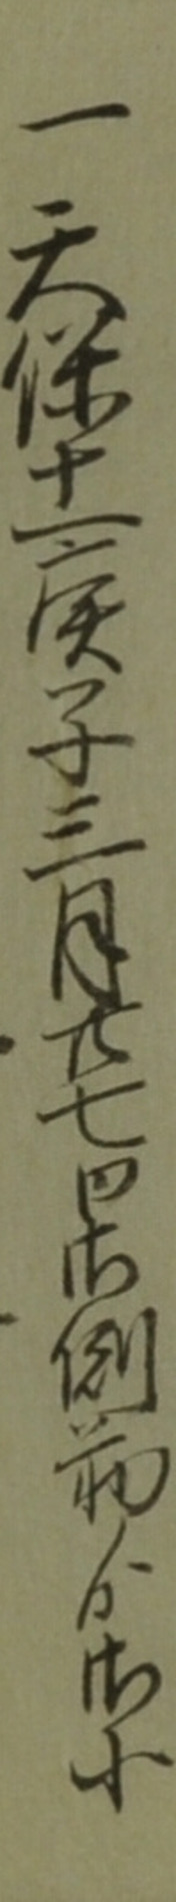一天保十一庚子三月廿七日廿七日御例ゟ御小
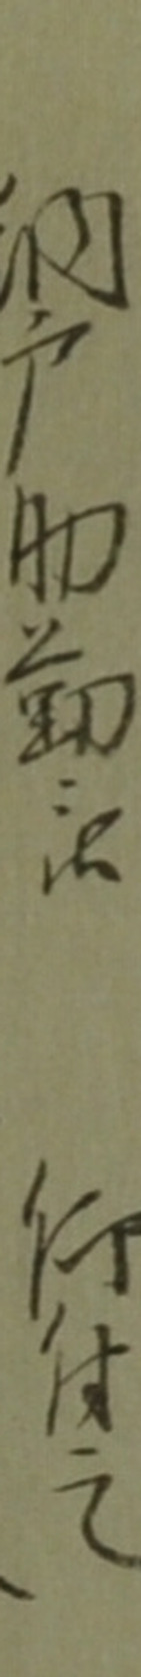納戸助勤被仰付之
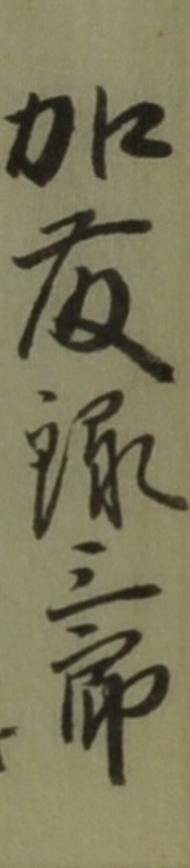加藤録三郎
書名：諸御役代々録（四）
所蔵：伊那市立高遠町図書館・合同会社AMANE
